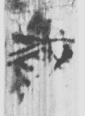歲
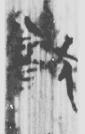猶
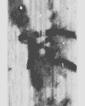五
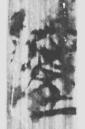穜
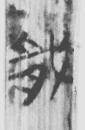歲
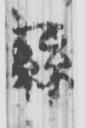絲
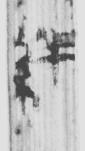絴
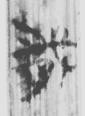歲
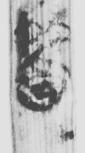{竹亯}
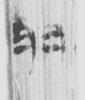羽
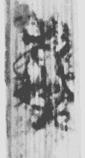{鹿毛}
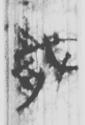歲
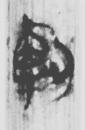解
